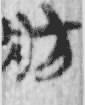○（病）
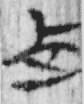上B
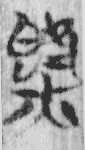○（氣）
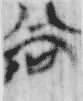尚
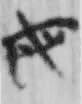母
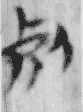死
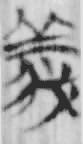義
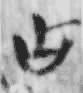占
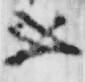之
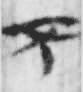不
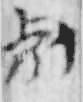死
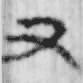又
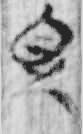見
